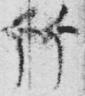比
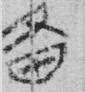备（邍）
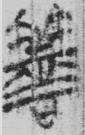○（筮）
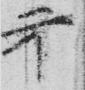元
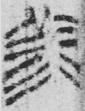羕（永）
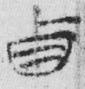貞
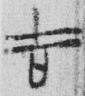吉
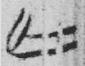亡（无）
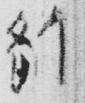咎
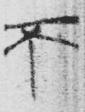不
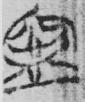○（寧）
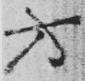方
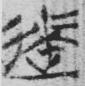逨（來）
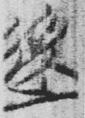○（後）
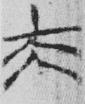夫
